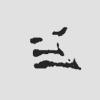三
